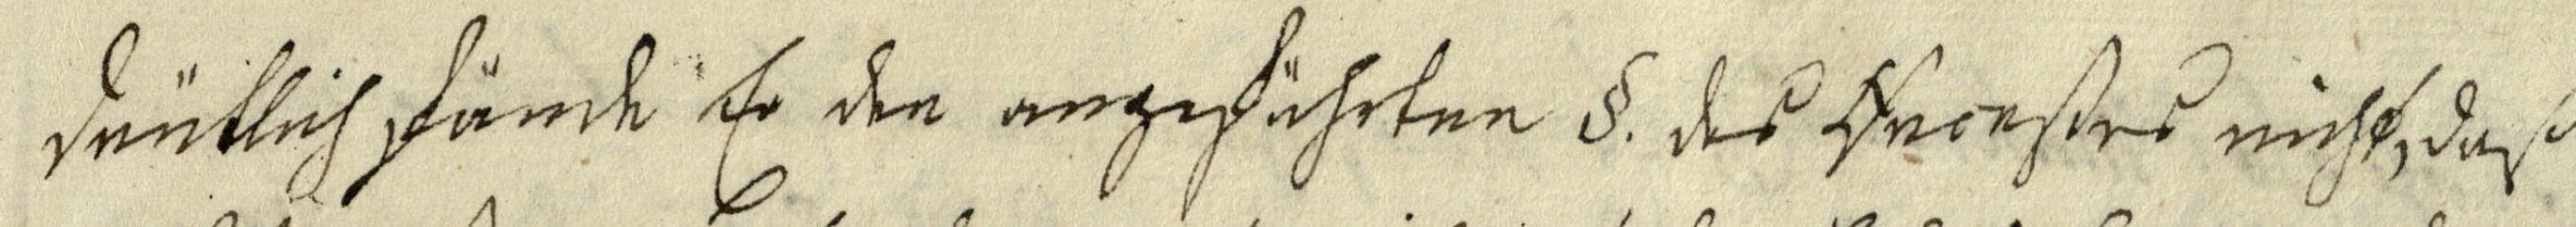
deutlich fände Er den angeführten § des Receßes nicht, daß
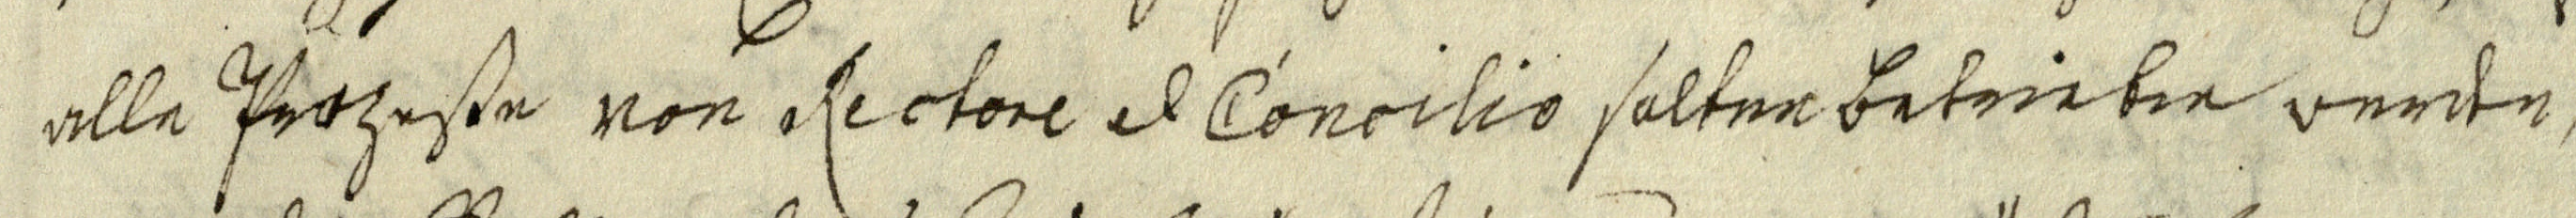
alle Prozeße von Rectore et Concilio solten betrieben werden,
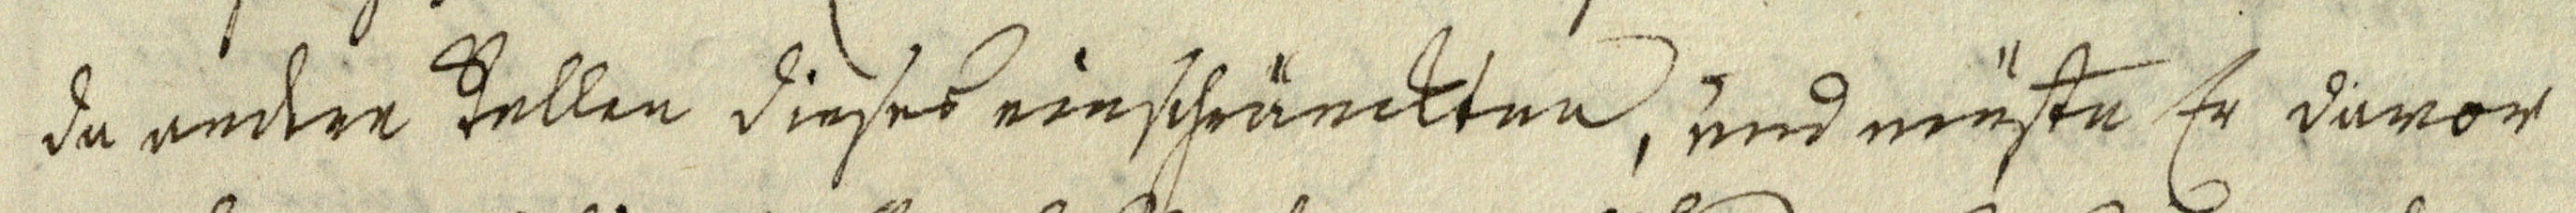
da andere Stellen dieses einschränckten, und müste Er davor
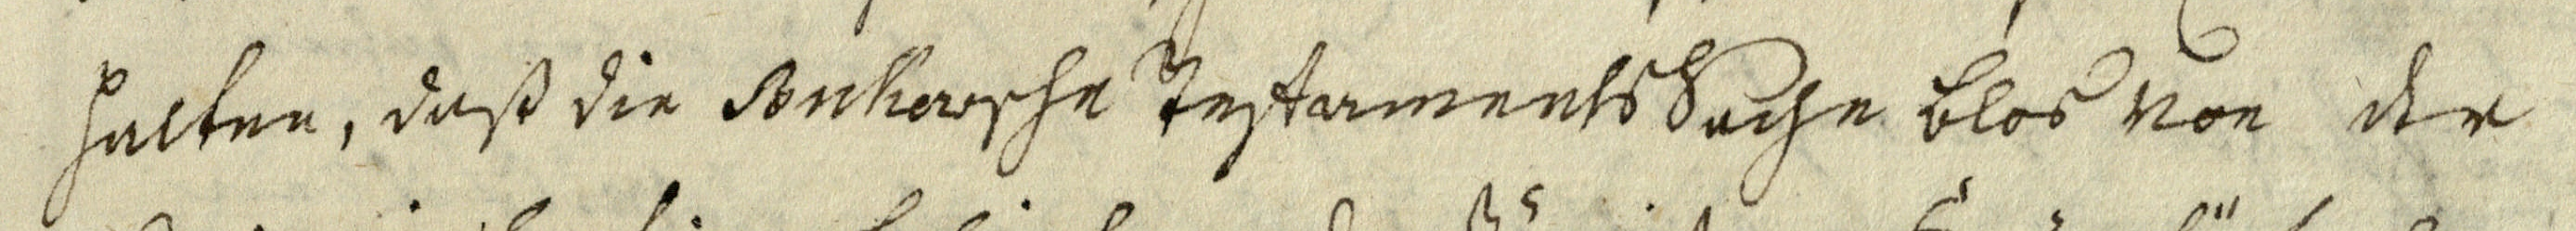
halten, daß die Bukowsche TestamentsSache blos von der
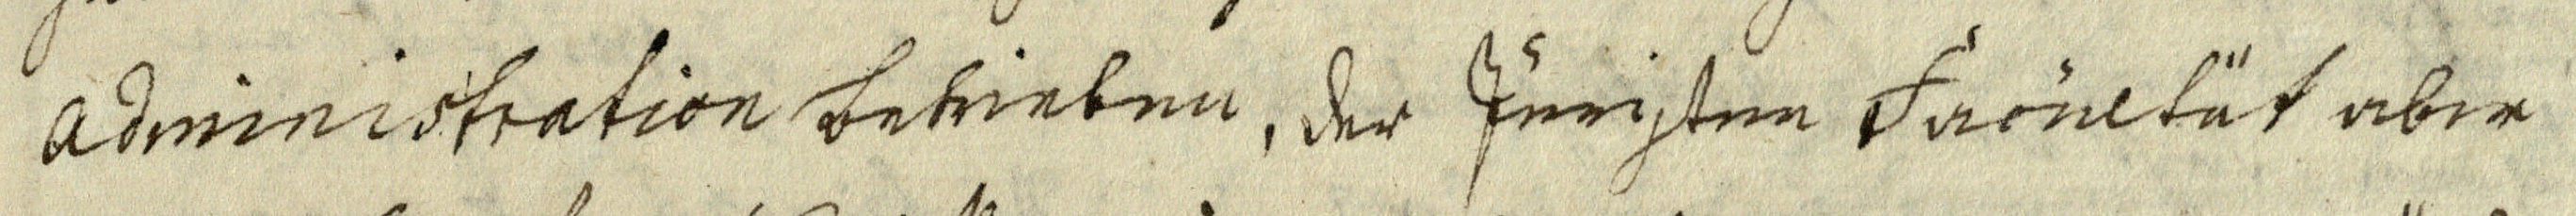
Administration betrieben, der Juristen Facultät aber
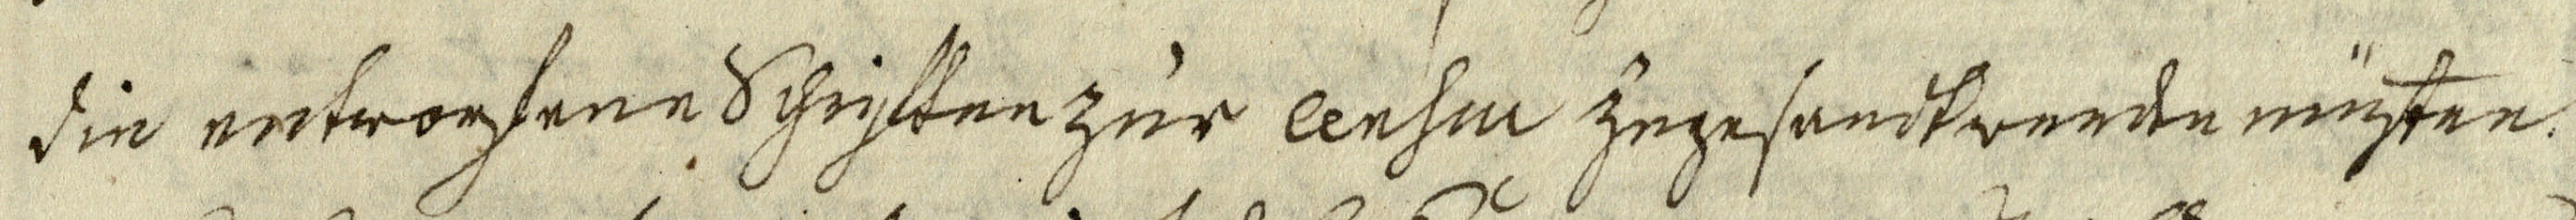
die entworfene Schriften zur censur zugesandt werden müsten.
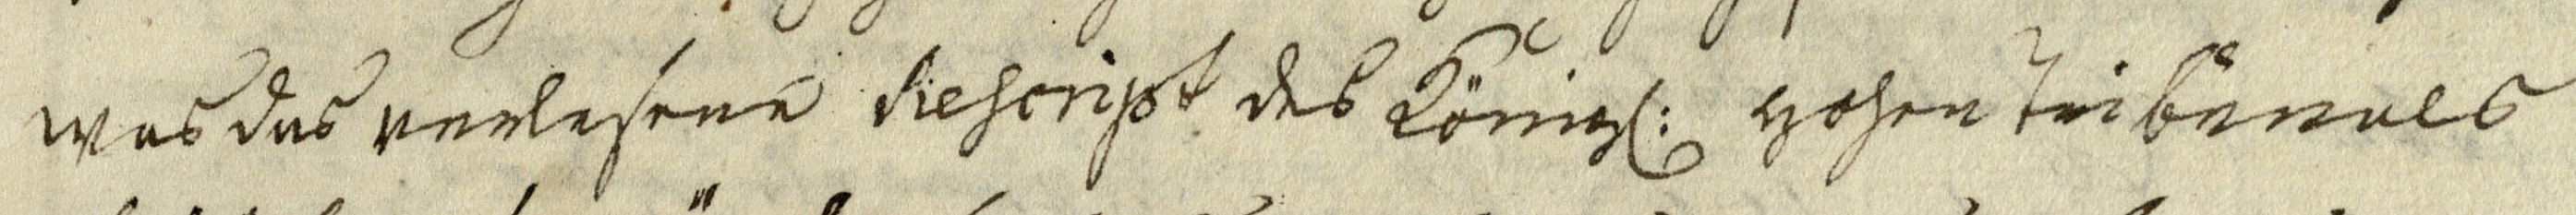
Was das verlesene Rescript des Königl. Hohen Tribunals
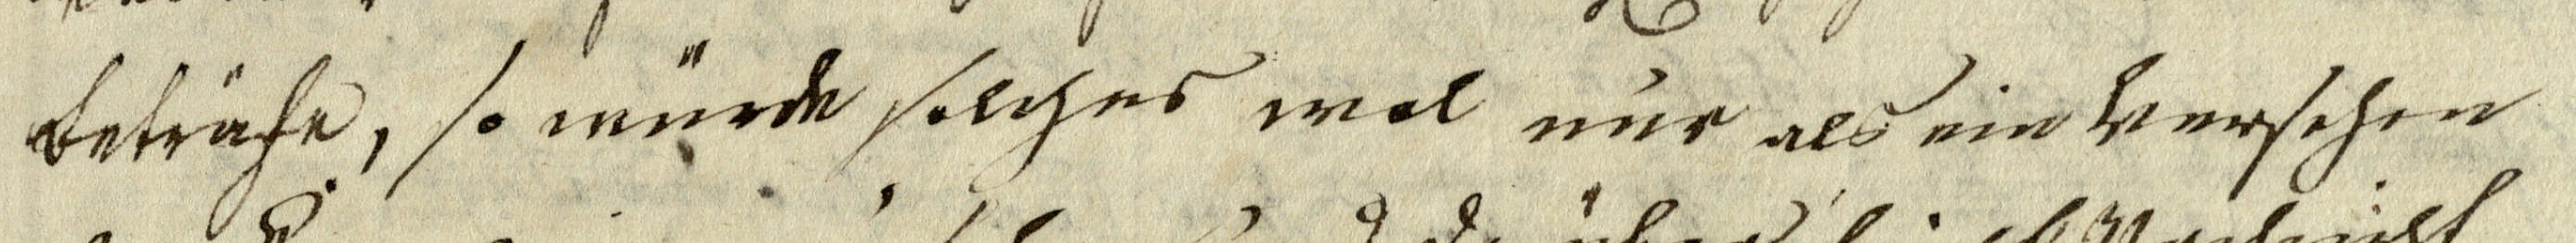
beträfe, so würde solches wol nur als ein Versehen
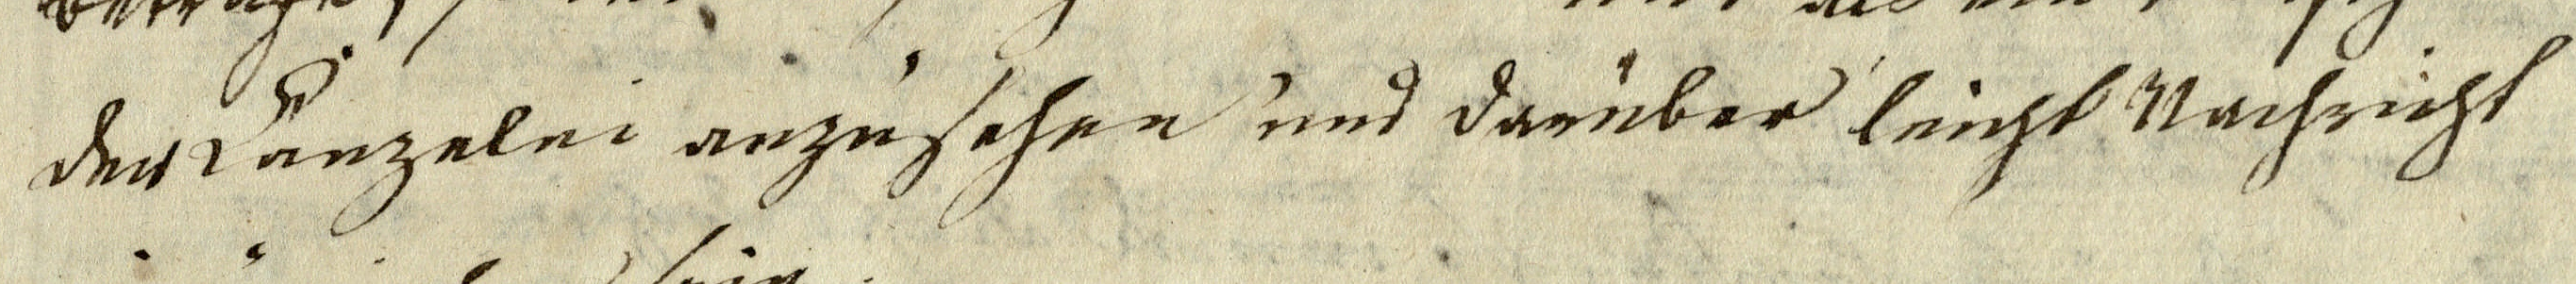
der Kanzelei anzusehen und darüber leicht Nachricht
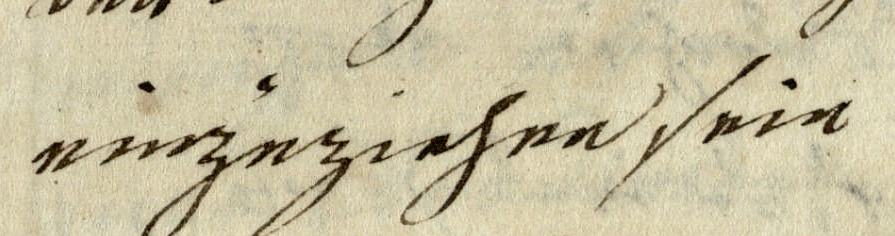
einzuziehen sein.
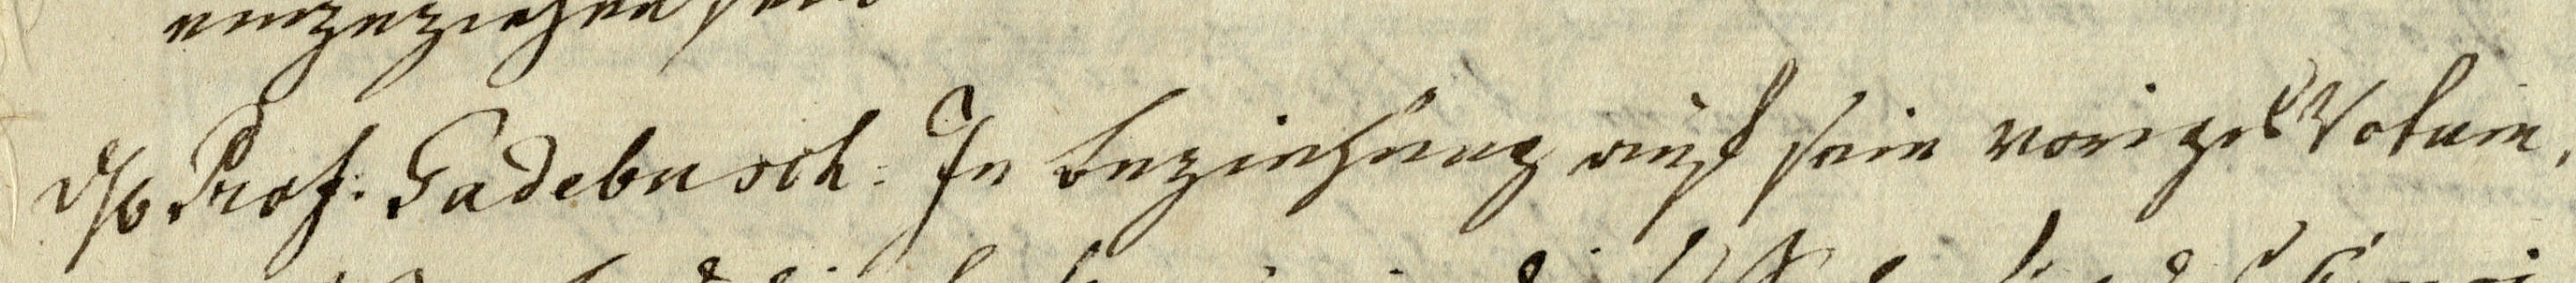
dh Prof. Gadebusch. In Beziehung auf sein voriges Votum
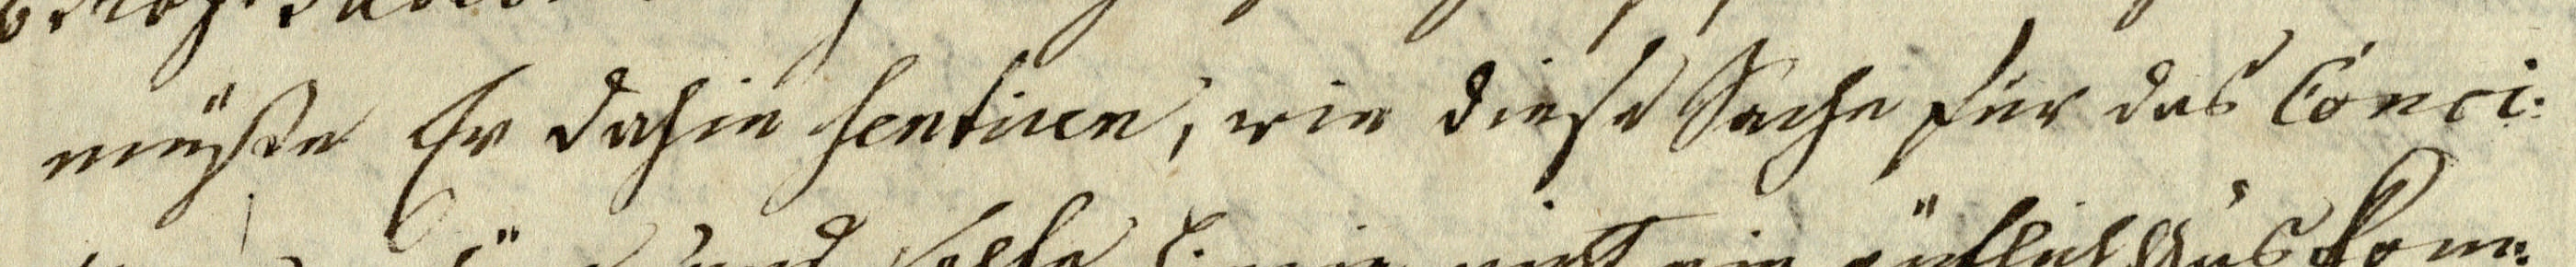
müße Er dahin sentiren, wie diese Sache für das Conci¬
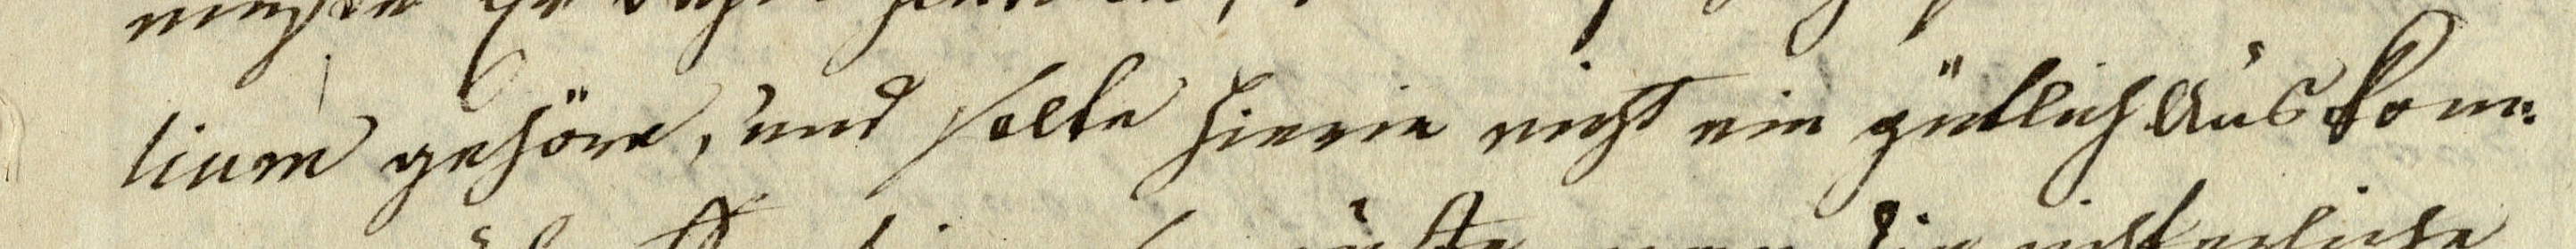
lium gehöre, und solte hierin nicht ein gütlich Auskom¬
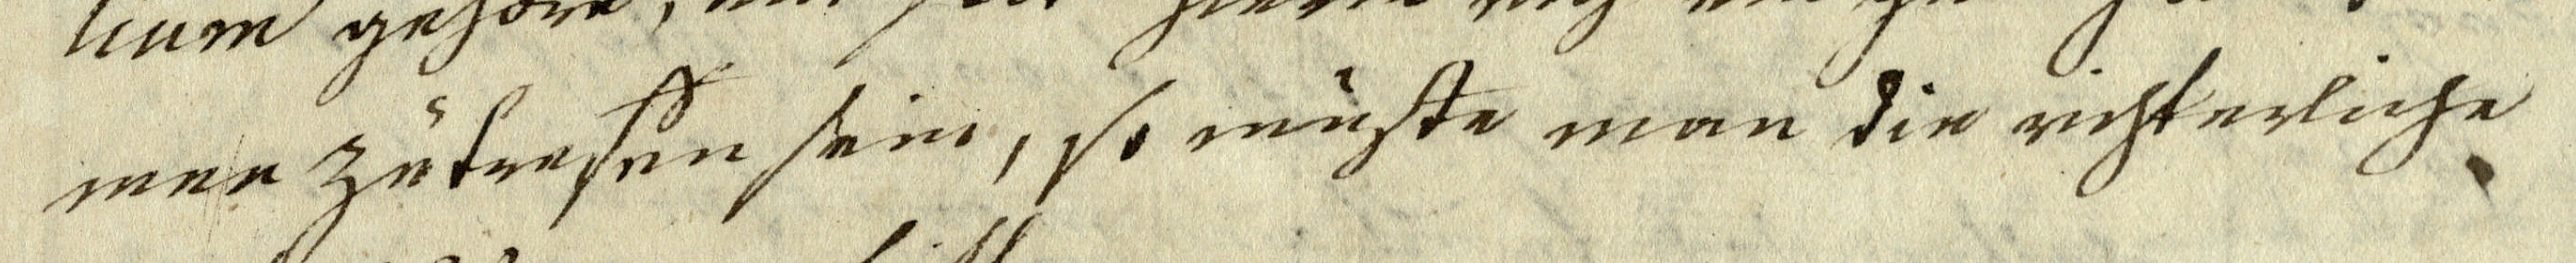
men zutreffen sein, so müste man die richterliche
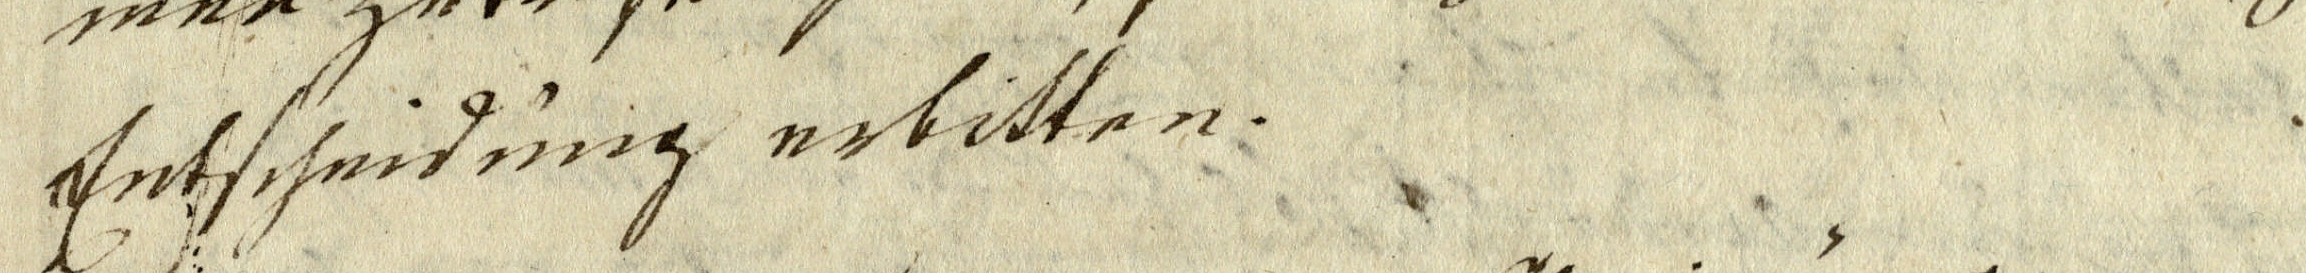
Entscheidung erbitten.
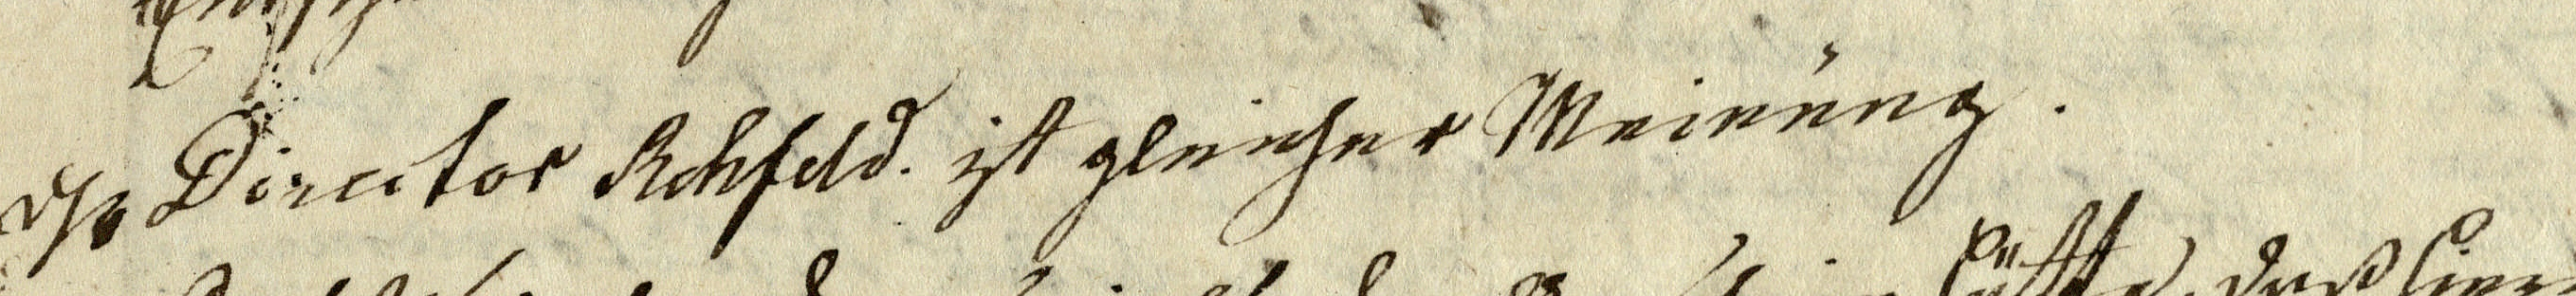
dh Director Rehfeld. ist gleicher Meinung.
